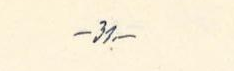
31
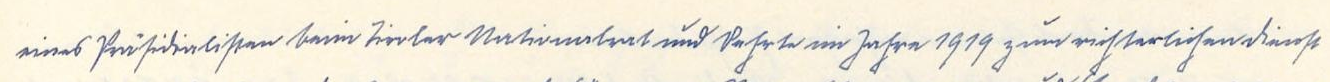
eines Präsidialisten beim Tiroler Nationalrat und kehrte im Jahre 1919 zum richterlichen Dienst
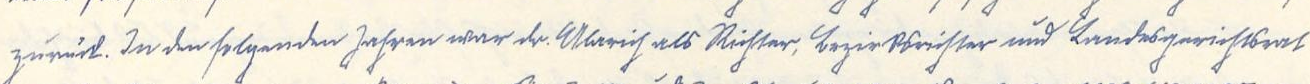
zurück. In den folgenden Jahren war Dr. Alarich als Richter, Bezirksrichter und Landesgerichtsrat
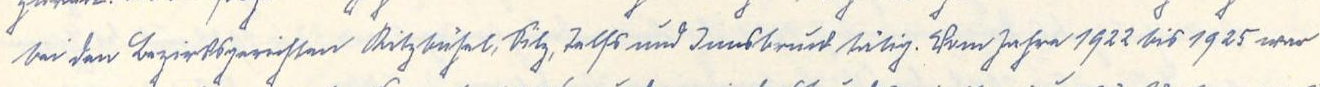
bei den Bezirksgerichten Kitzbühel, Silz, Telfs und Innsbruck tätig. Vom Jahre 1922 bis 1925 war
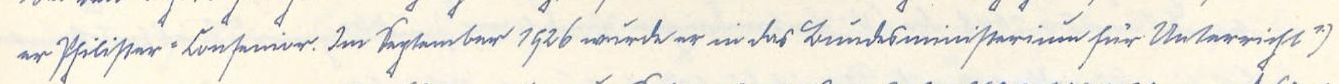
er Philister-Consenior. Im September 1926 wurde er in das Bundesministerium für Unterricht 1)
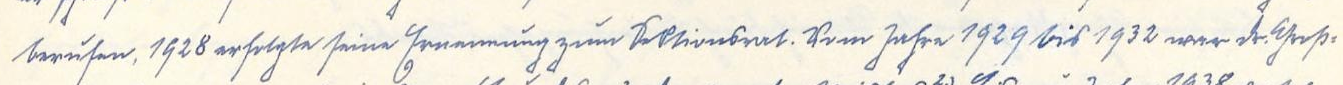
berufen, 1928 erfolgte seine Ernennung zum Sektionsrat. Vom Jahre 1929 bis 1932 war Dr. Groß-
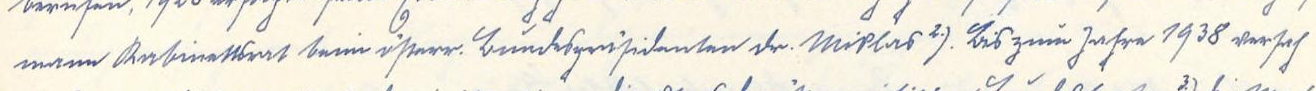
mann Kabinettsrat beim österr. Bundespräsidenten Dr. Miklas. 2) Bis zum Jahre 1938 versah
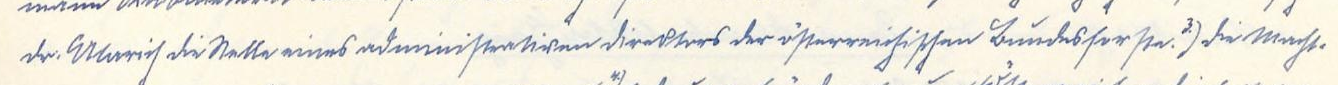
Dr. Alarich die Stelle eines administrativen Direktors der österreichischen Bundesforste. 3)
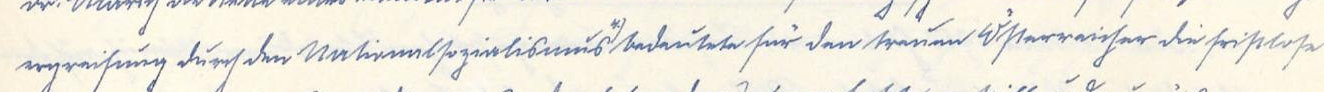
Die Machtergreifung durch den Nationalsozialismus 4) bedeutete für den treuen Österreicher die fristlose
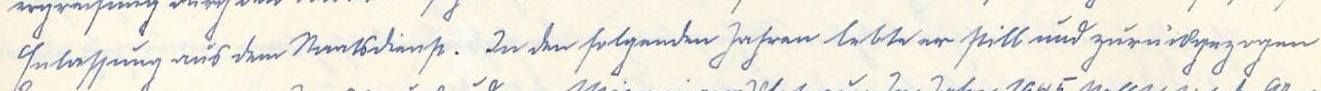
Entlassung aus dem Staatsdienst. In den folgenden Jahren lebte er still und zurückgezogen
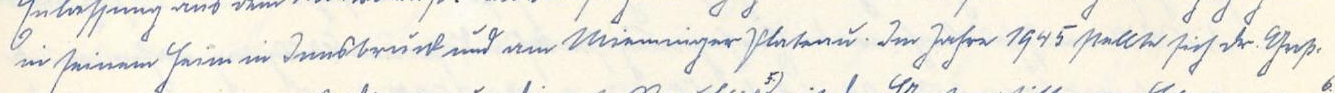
in seinem Heim in Innsbruck und am Mieminger Plateau. Im Jahre 1945 stellte sich Dr. Groß-
